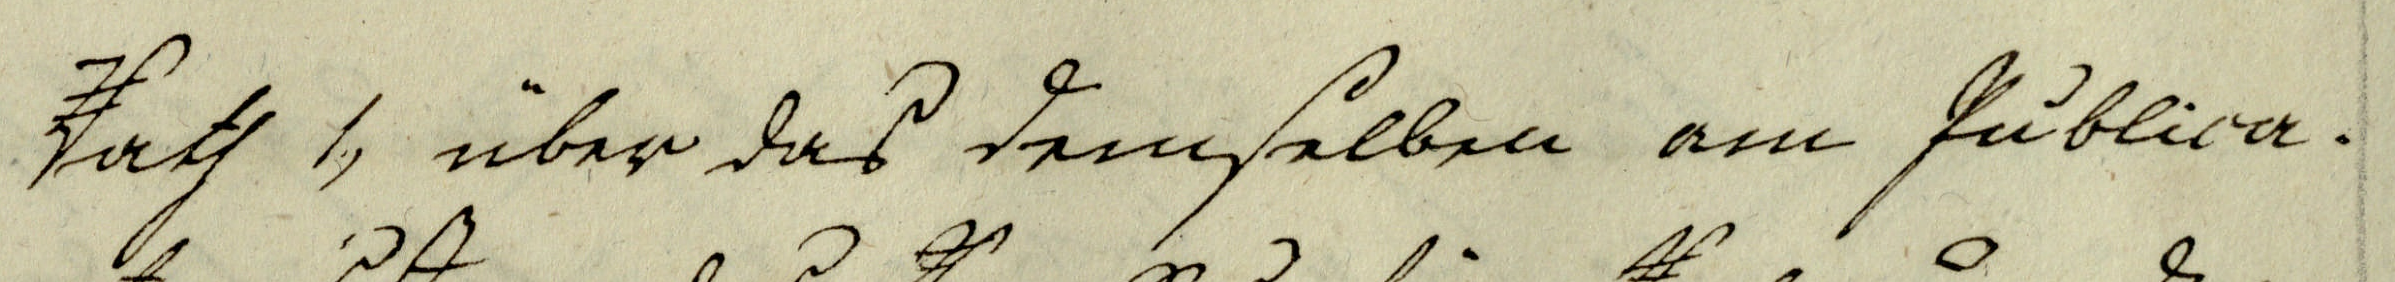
Rath 1., über das demselben am Publica¬
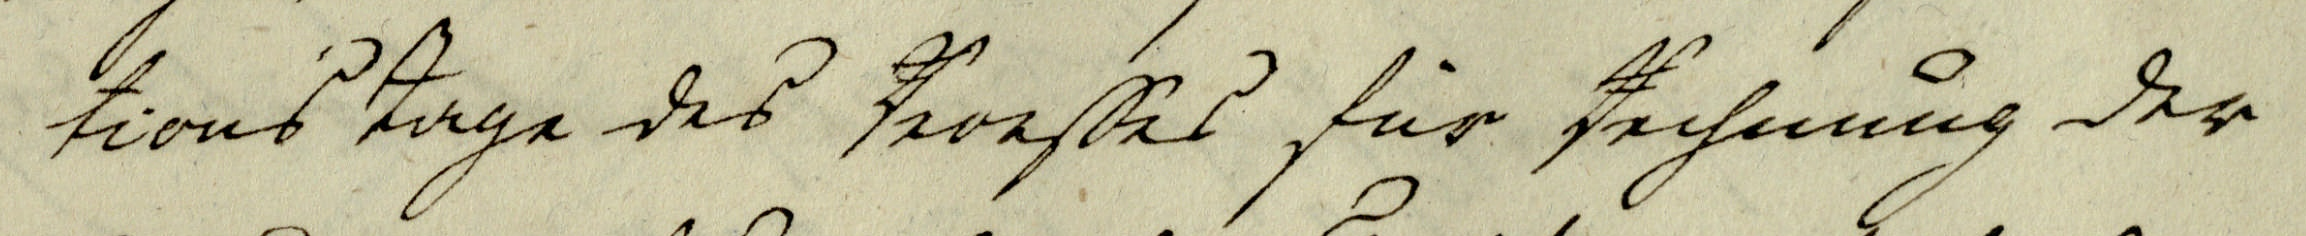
tions Tage des Recesses für Rechnung der
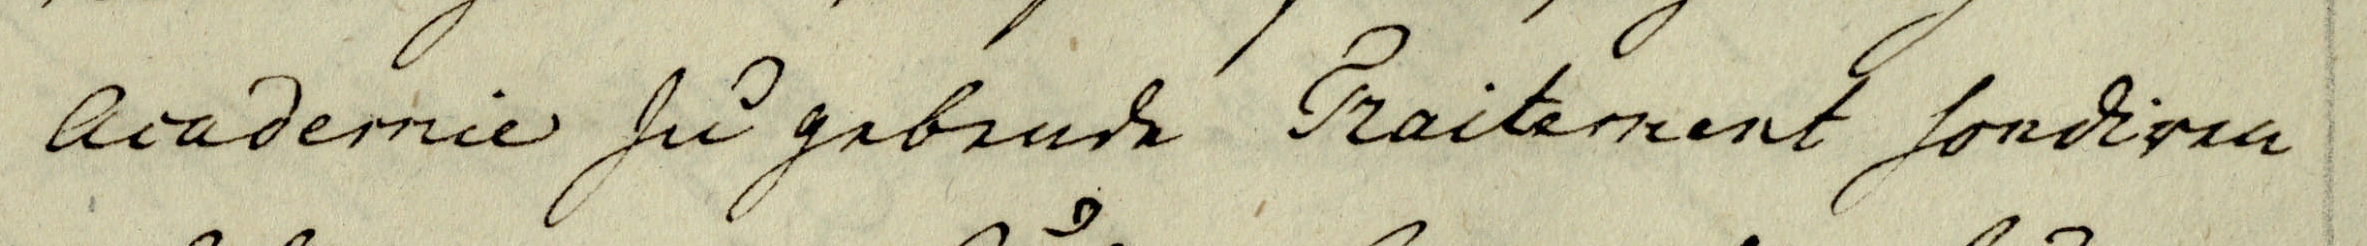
Academie zu gebende Traitement sondiren
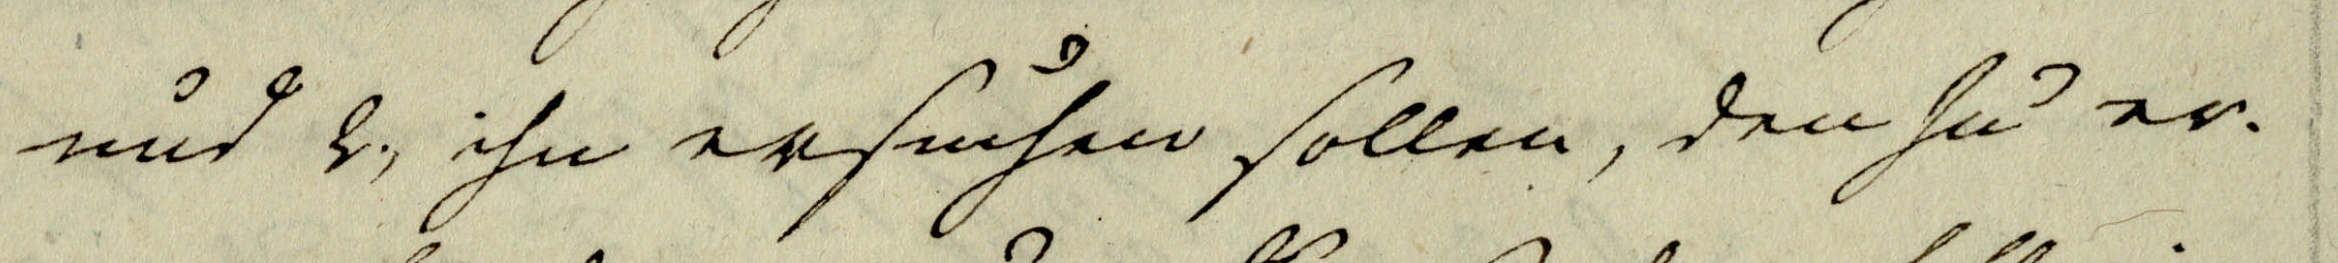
und 2., ihn ersuchen sollen, den zu er¬
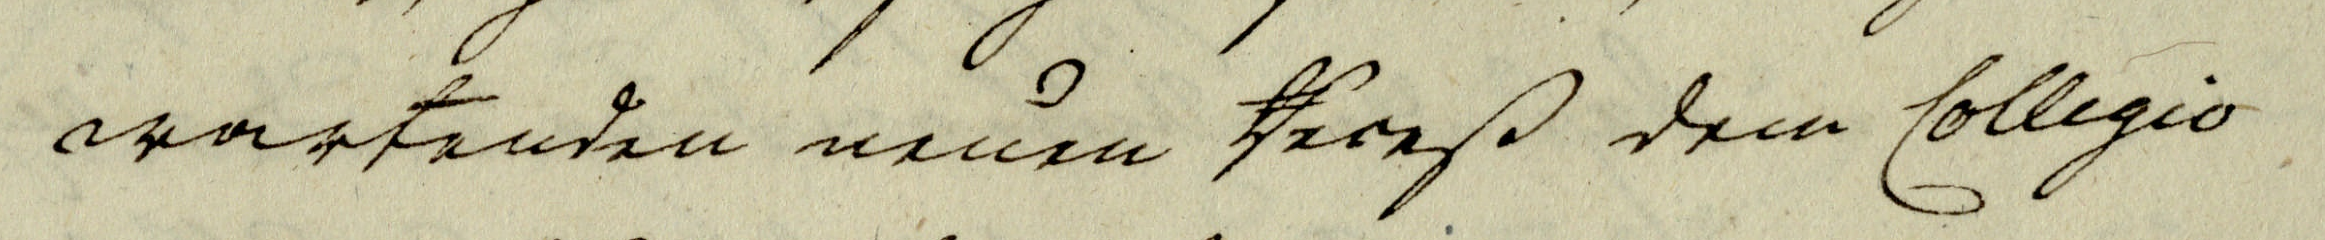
wartenden neuen Receß dem Collegio
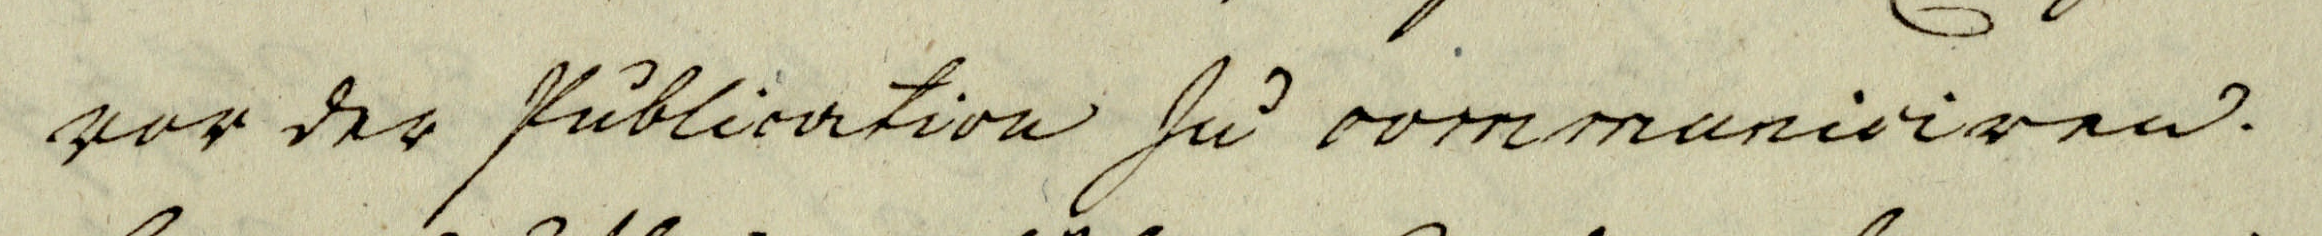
vor der Publication zu communiciren.
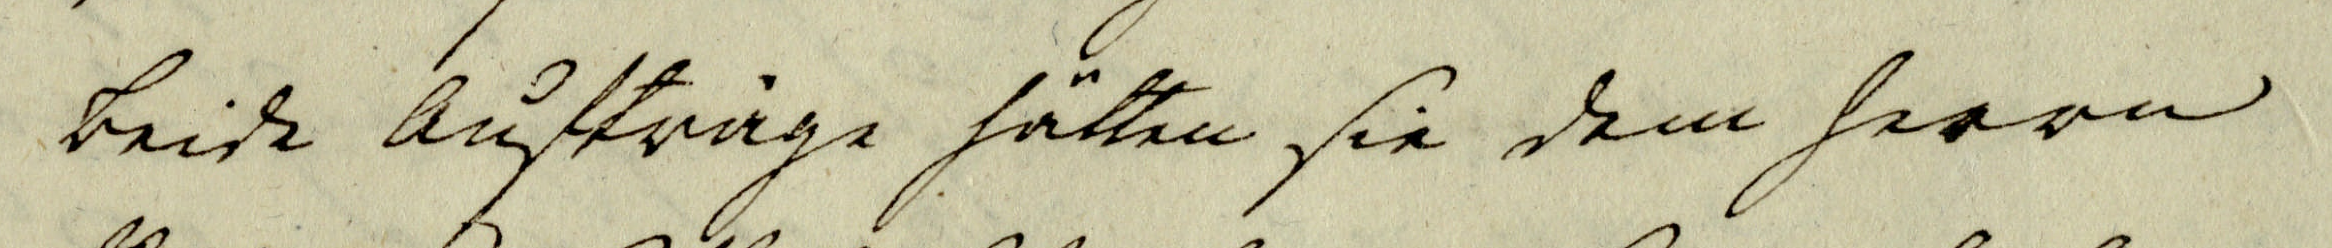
Beide Aufträge hätten sie dem Herrn
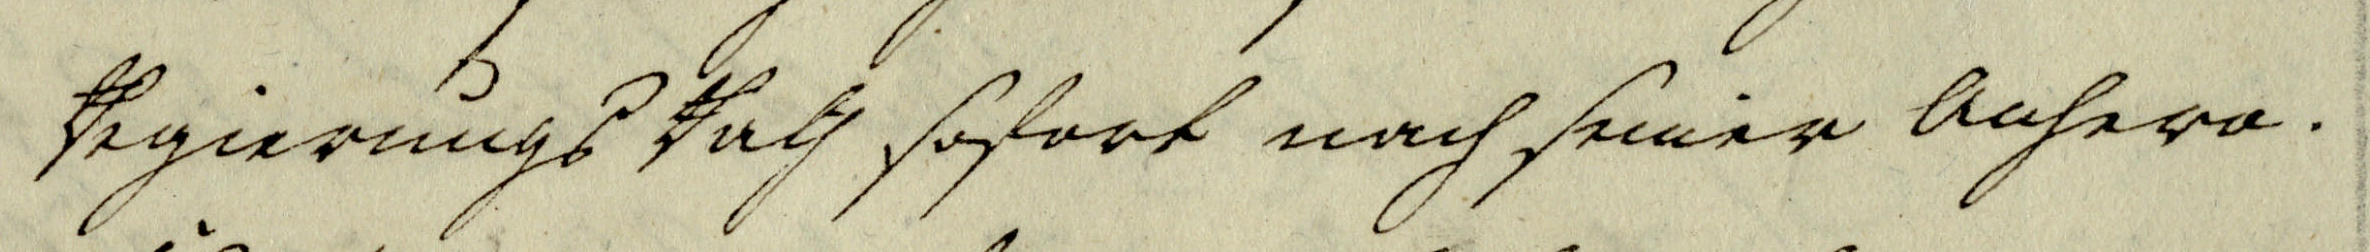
Regierungs Rath sofort nach seiner Anhero¬
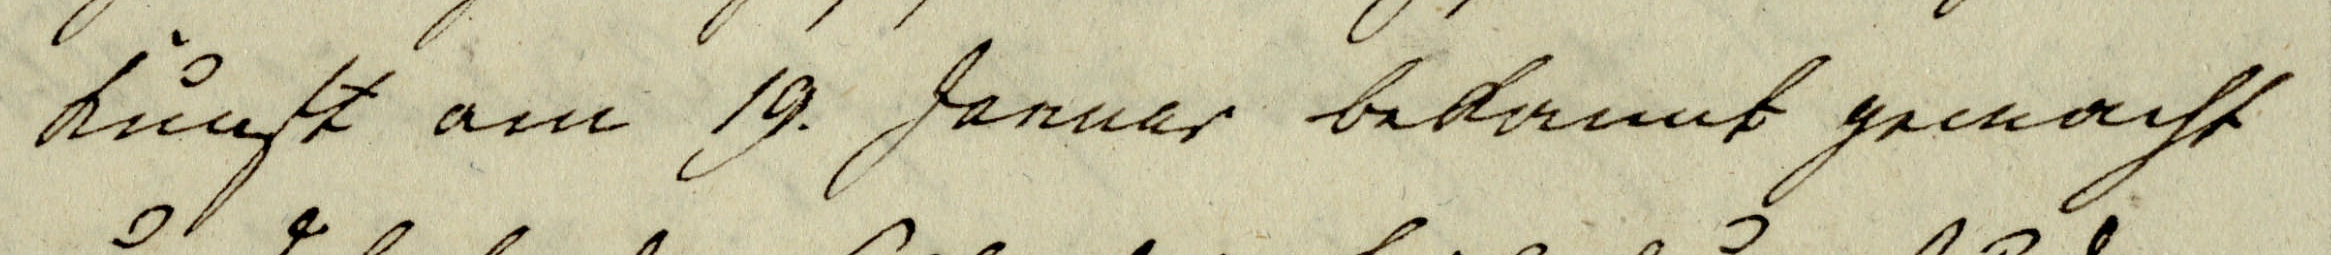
kunft am 19. Januar bekannt gemacht
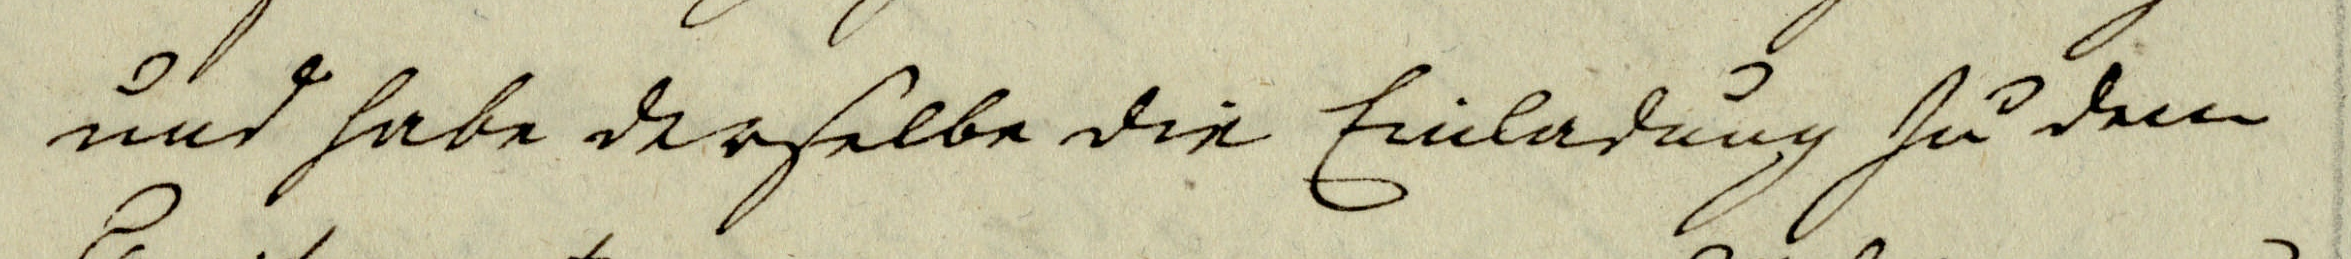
und habe derselbe die Einladung zu dem
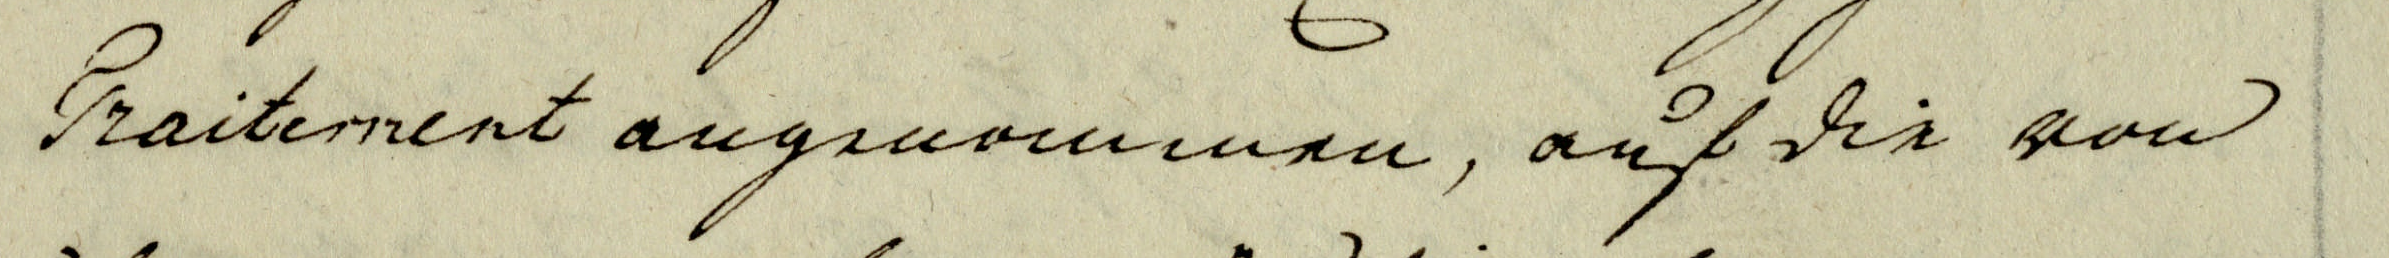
Traitement angenommen, auf die von
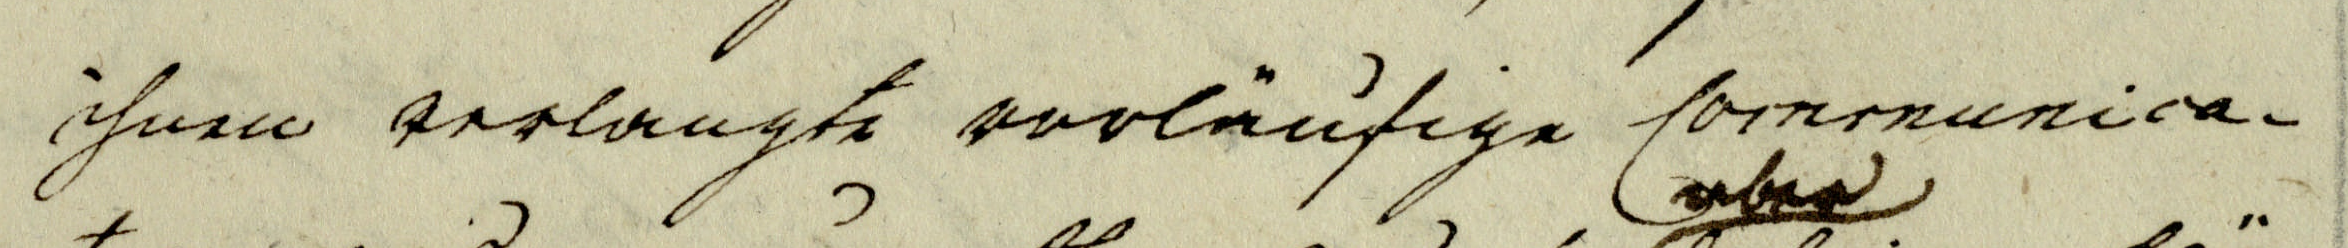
ihnen verlangte vorläufige Communica¬
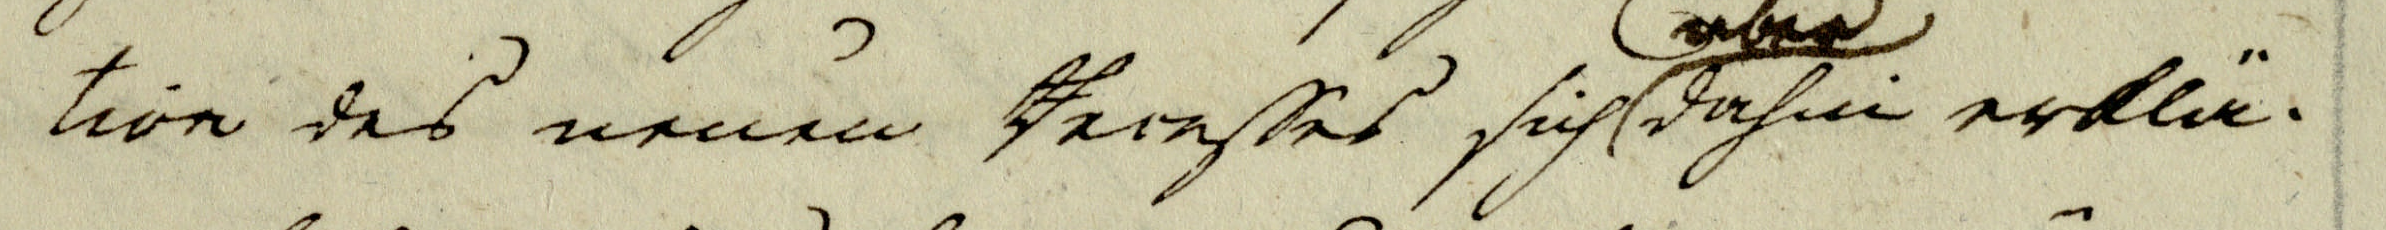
tion des neuen Recesses sich dahin erklä¬
